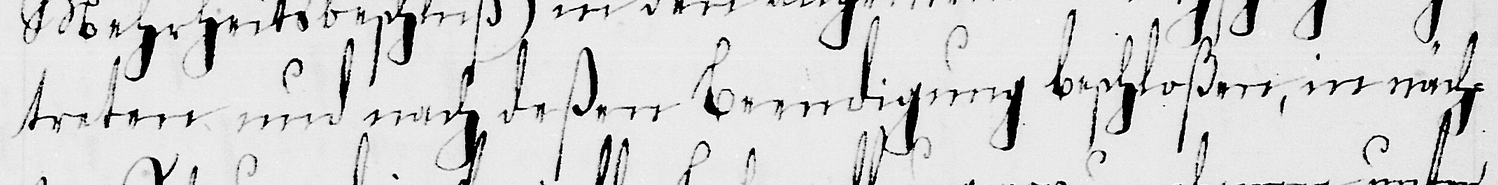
treten und nach deßen Beendigung beschloßen, in näch¬
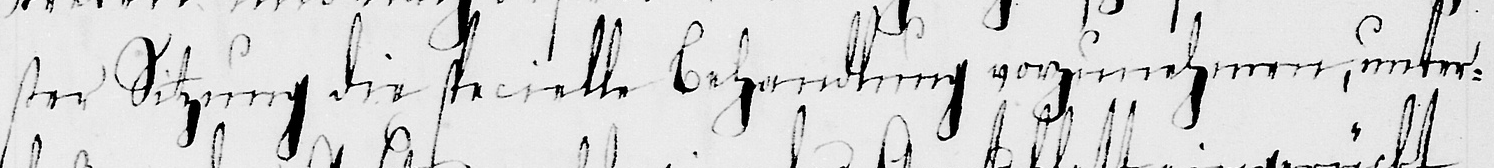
ster Sitzung die specielle Behandlung vorzunehmen, unter¬
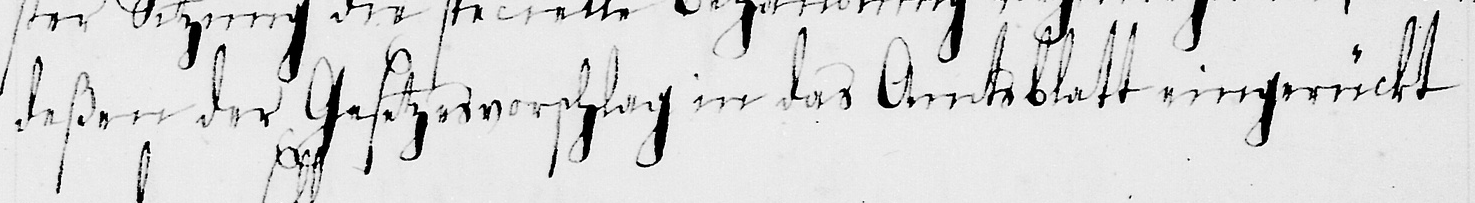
deßen der Gesetzesvorschlag in das Amtsblatt eingerückt
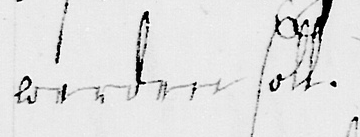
werden soll.
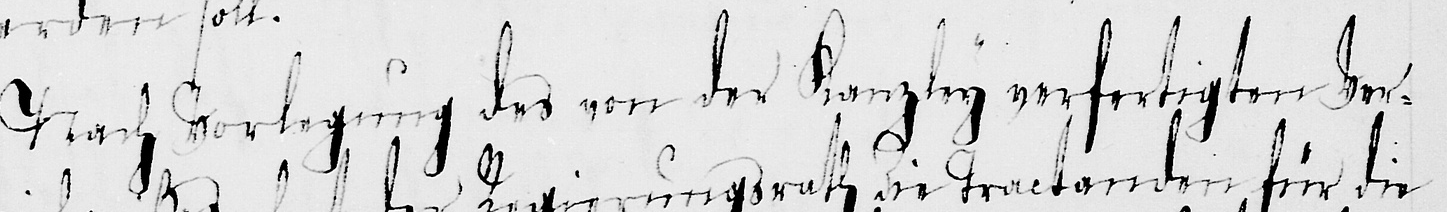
Nach Vorlegung des von der Kanzley verfertigten Ver¬
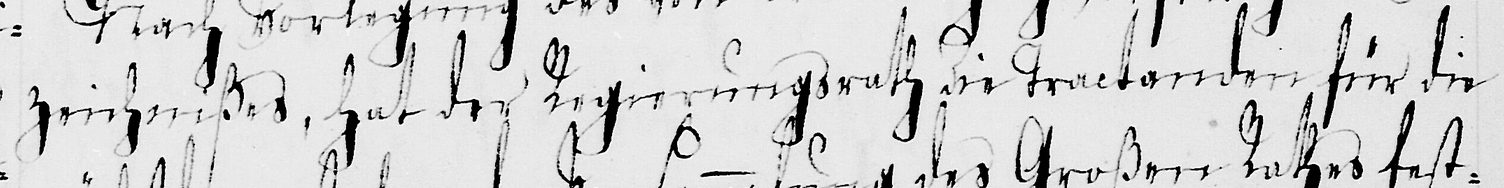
zeichnißes, hat der Regierungsrath die Tractanden für die
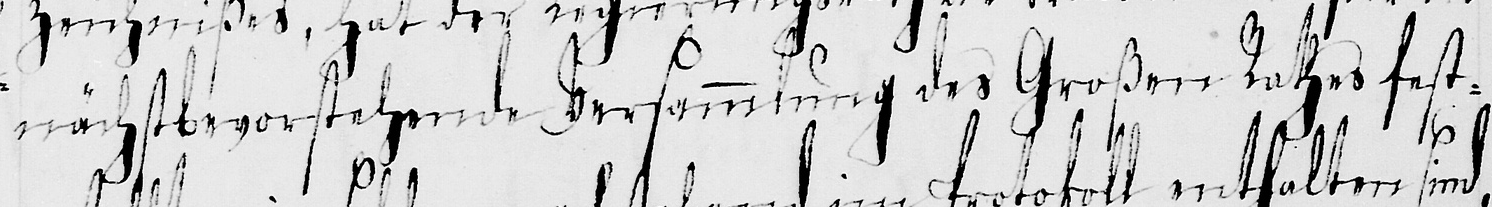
nächstbevorstehende Versammlung des Großen Rathes fest¬
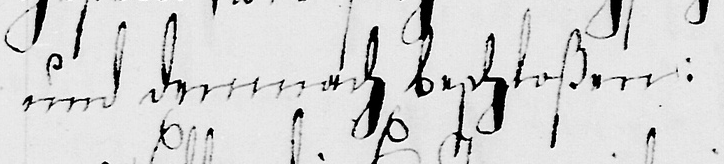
und demnach beschloßen:
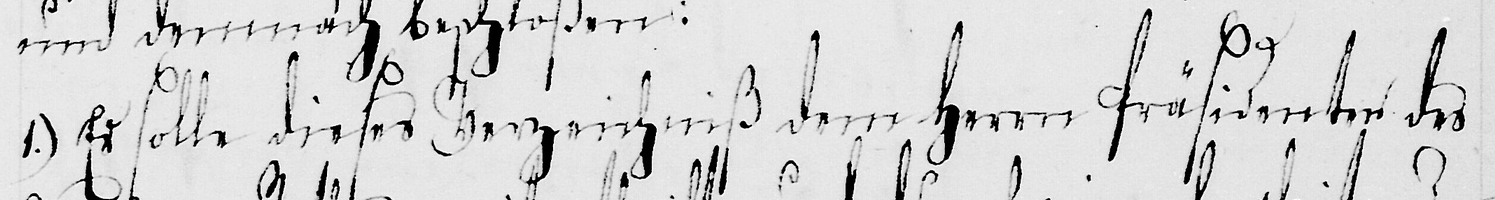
1.) Es solle dieses Verzeichniß dem Herrn Präsidenten des
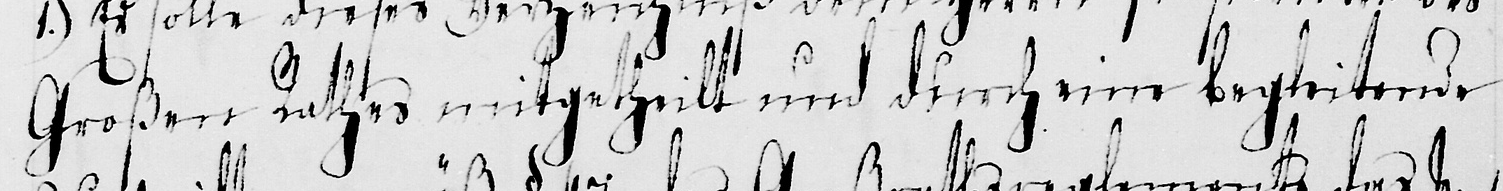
Großen Rathes mitgetheilt und durch eine begleitende
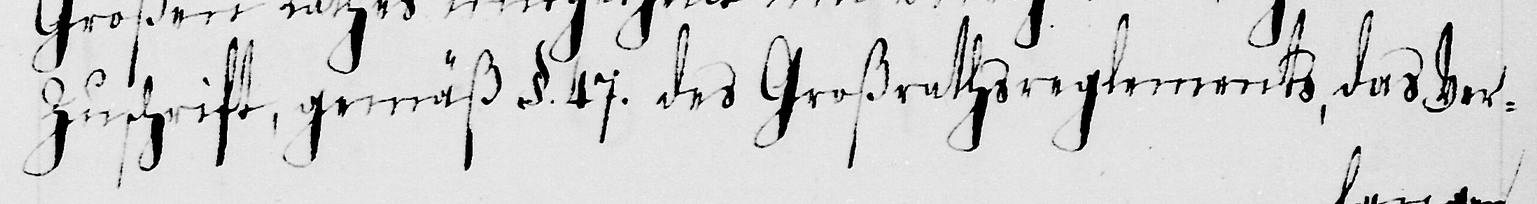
Zuschrift, gemäß §. 47. des Großrathsreglements, das Ver-
